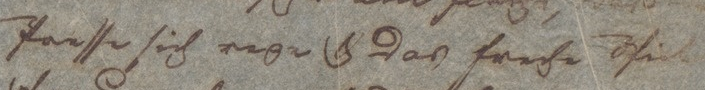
Presse sich rege & das freche Spiel
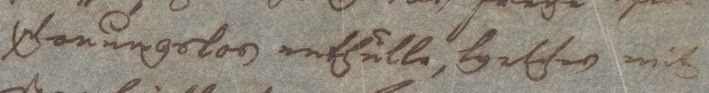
schonungslos enthülle, welches mit
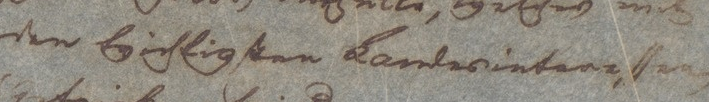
den wichtigsten Landesinteressen,
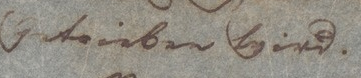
getrieben wird.
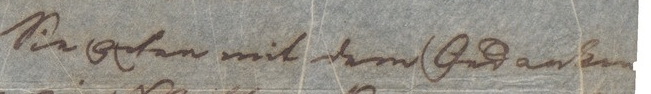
Sie gehen mit dem Gedanken
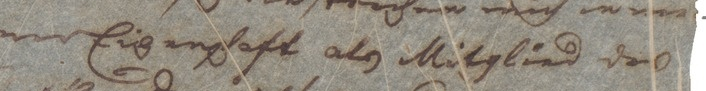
ner Eigenschaft als Mitglied des
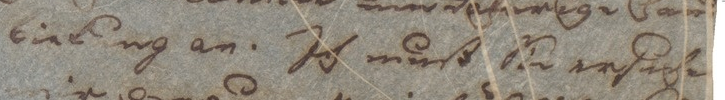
bietung an. Ich muß Sie ersuchen
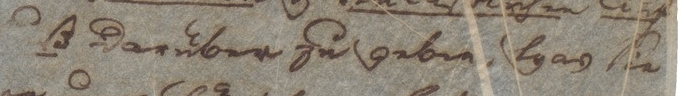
darüber zu geben, was Sie
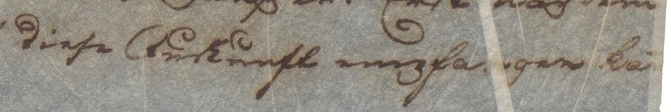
diese Auskunft empfangen, kann
